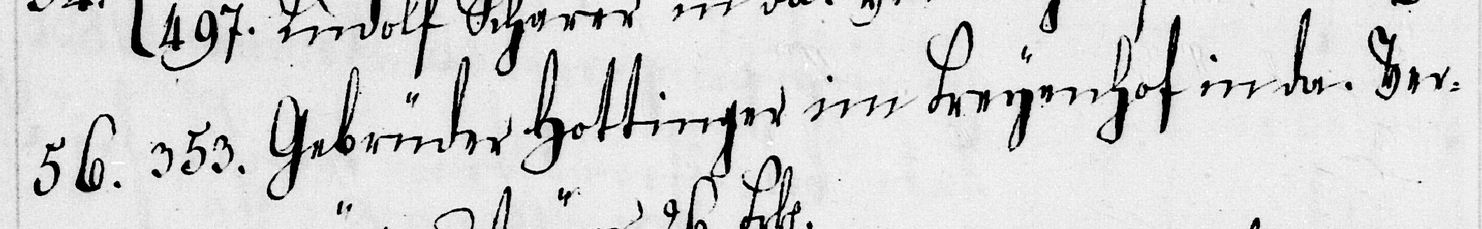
56. 353. Gebrüder Hottinger im Freyenhof in da. Ver¬
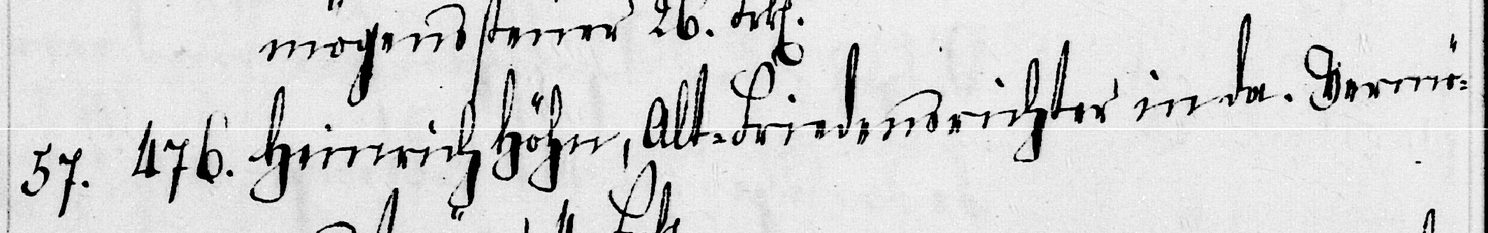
57.476. Heinrich Höhn, Alt-Friedensrichter in da. Vermö¬
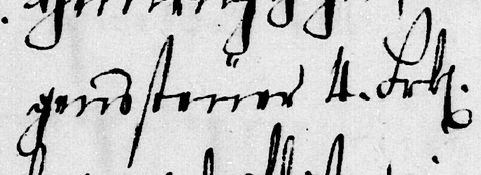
genssteuer 17. Frk[e¬
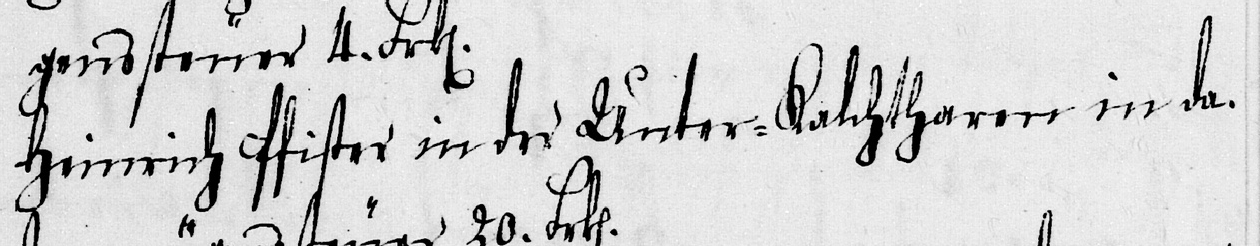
Heinrich Pfister in der Unter-Kalchtharen in da.
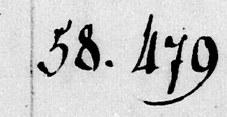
58. 479.
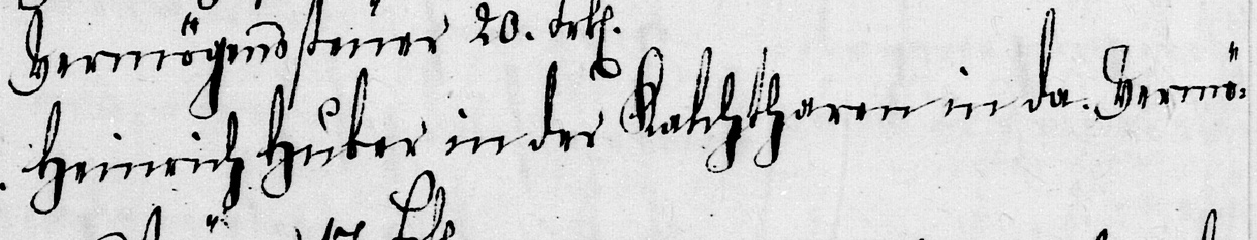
Heinrich Huber in der Kalchtharen in da. Vermö¬
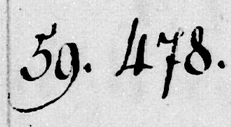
59. 478.
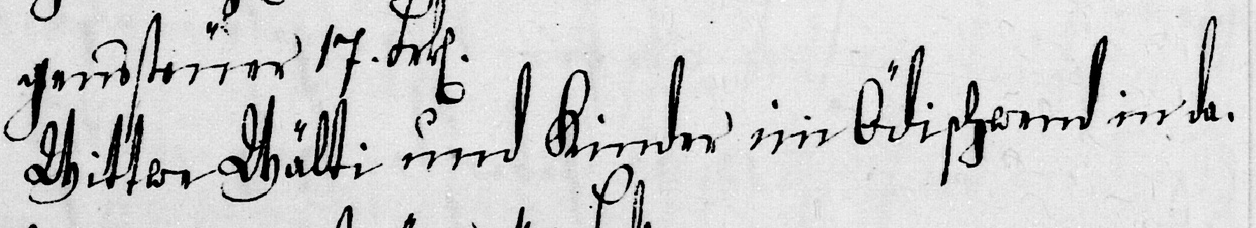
Wittwe Wälti und Kinder im Ödischwend in da.
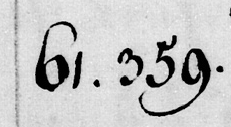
61. 359.
